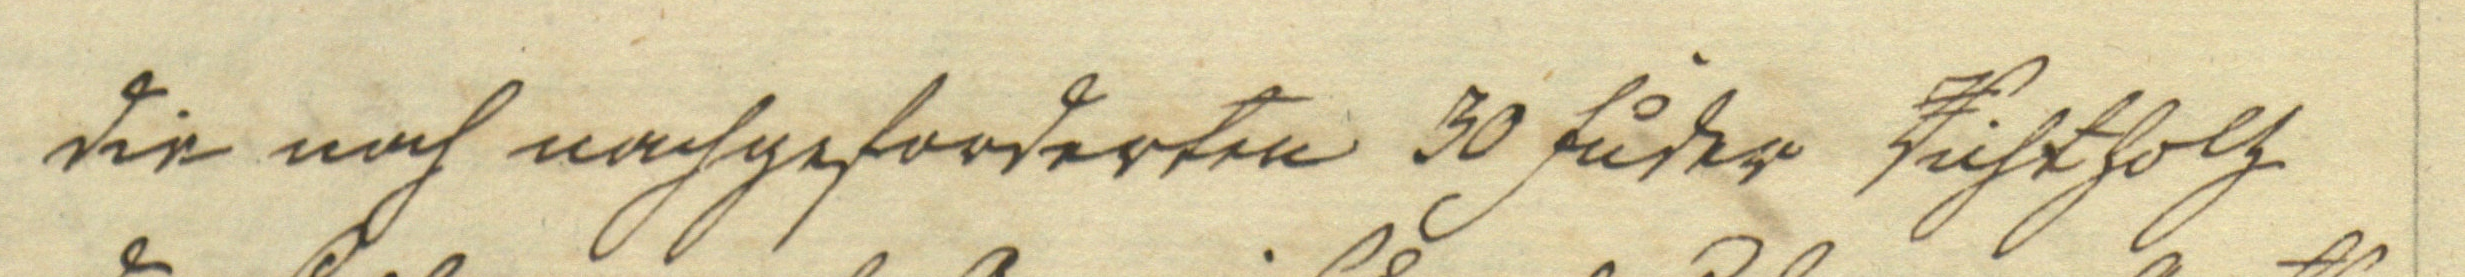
die noch nachgeforderten 30 Fudder Richtholz
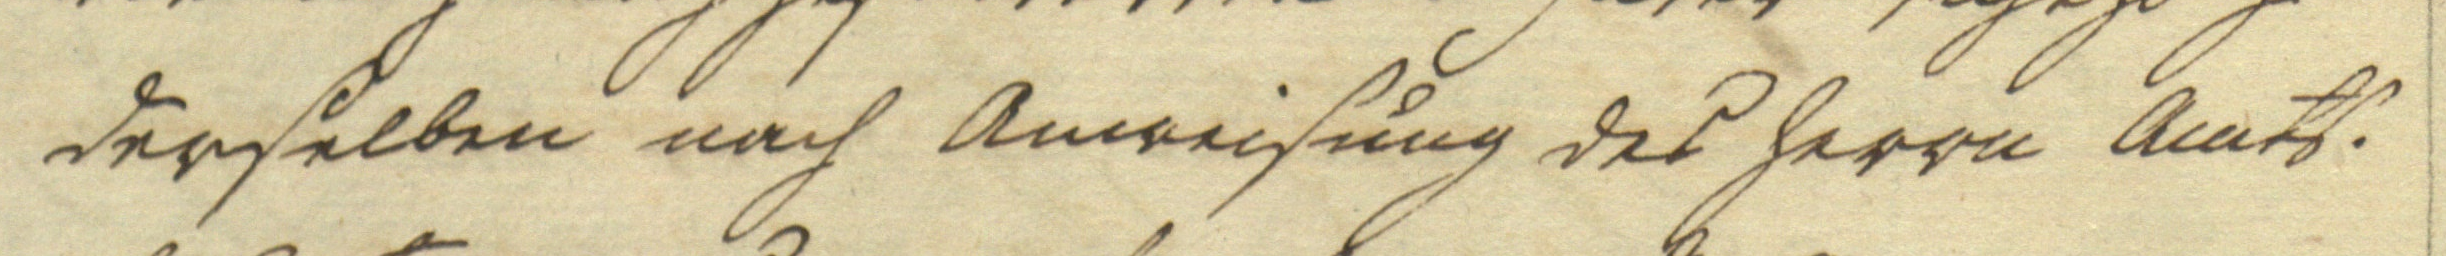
derselben nach Anweisung des Herrn Amts¬
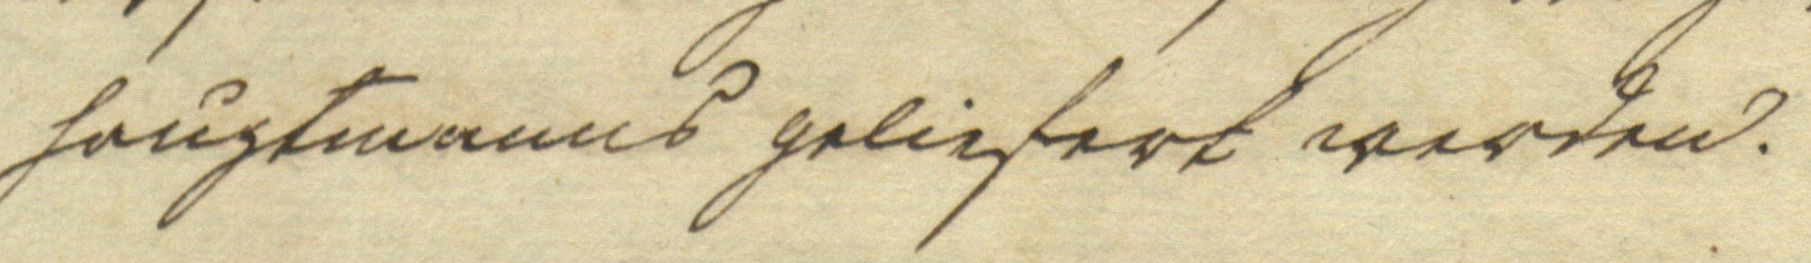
hauptmanns geliefert werden.
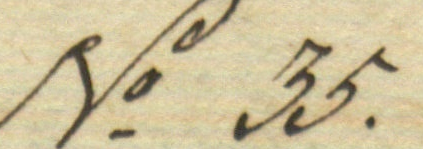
No 35.
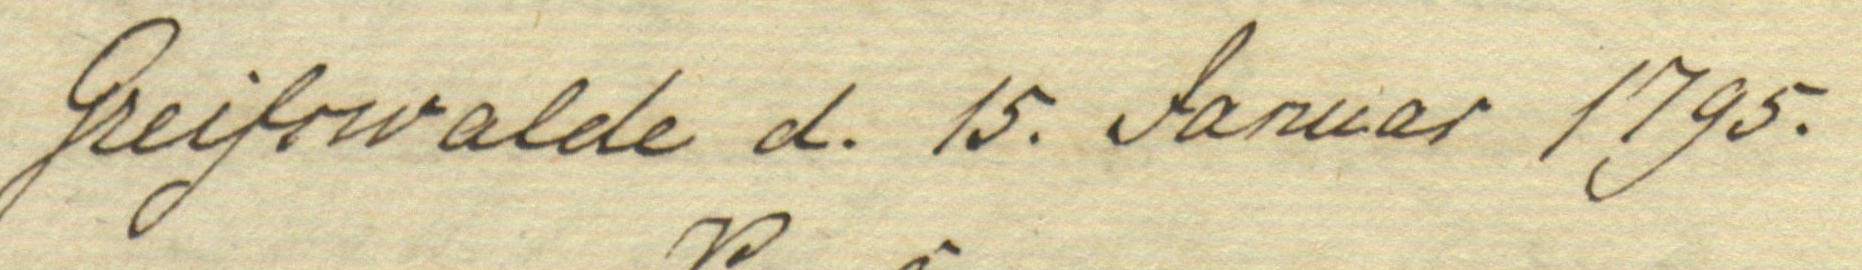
Greifswalde d. 15. Januar 1795.
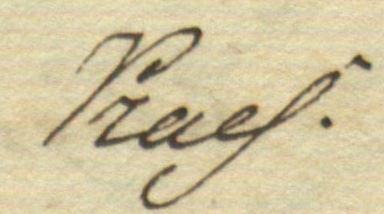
Praes.
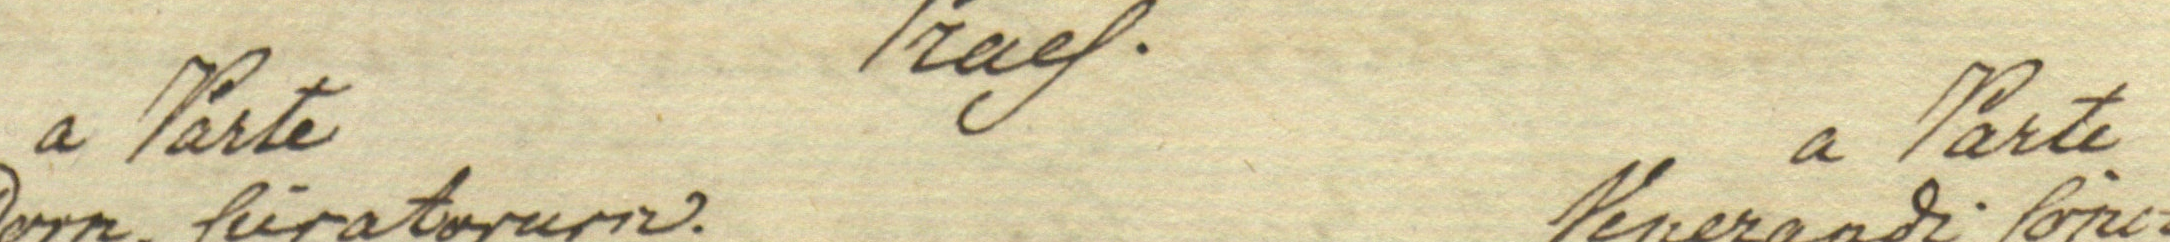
a Parte a Parte
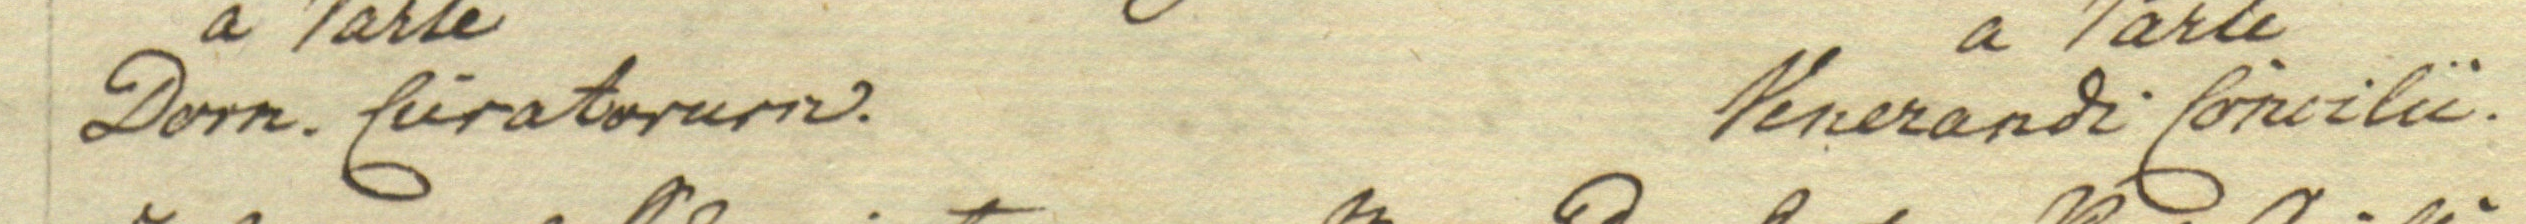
Dom. Curatorum. Venerandi Concilii
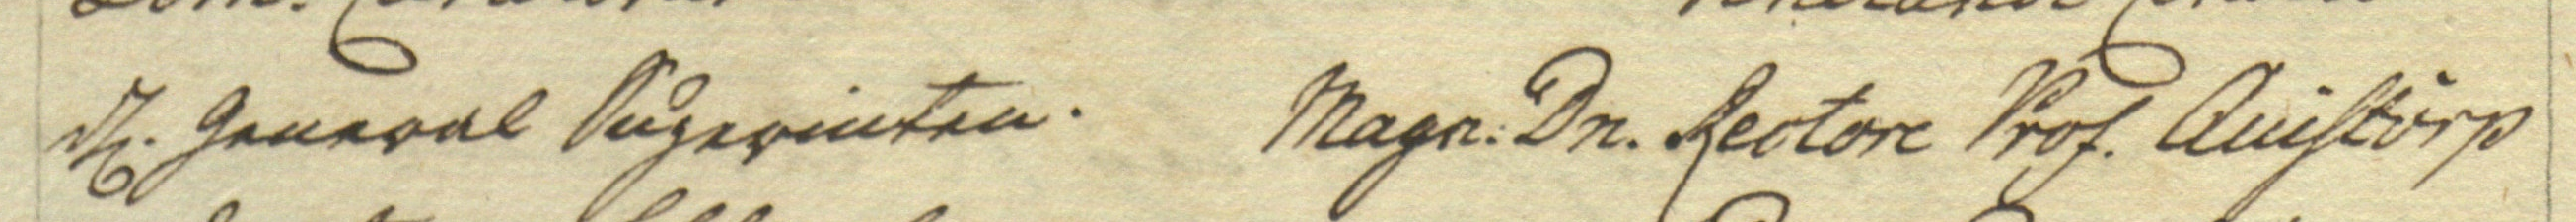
dh. General Superinten¬ Magn. Dn. Rector Prof. Quistorp
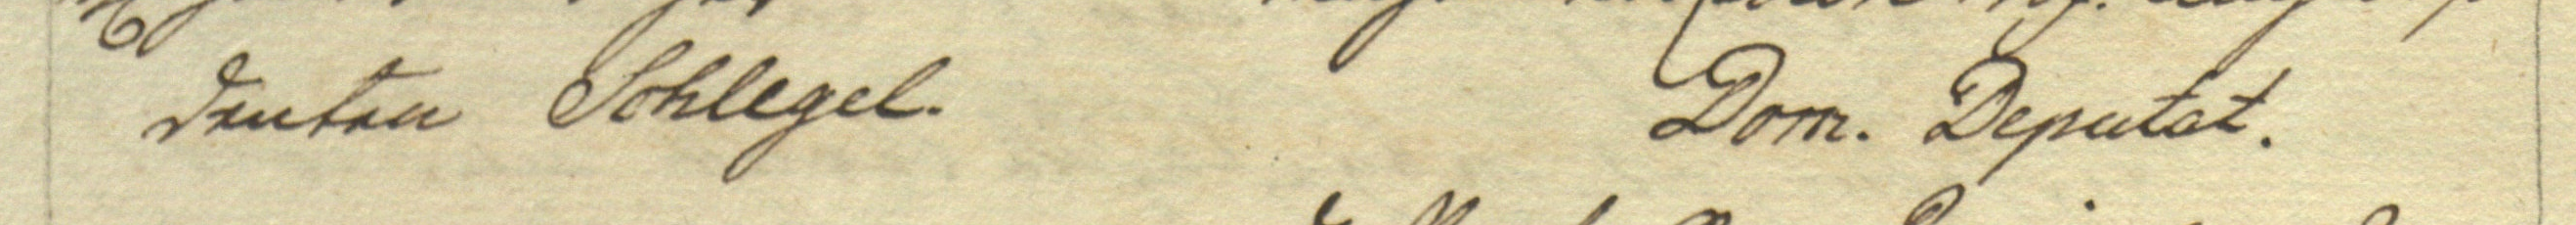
denten Schlegel. Dom. Deputat.
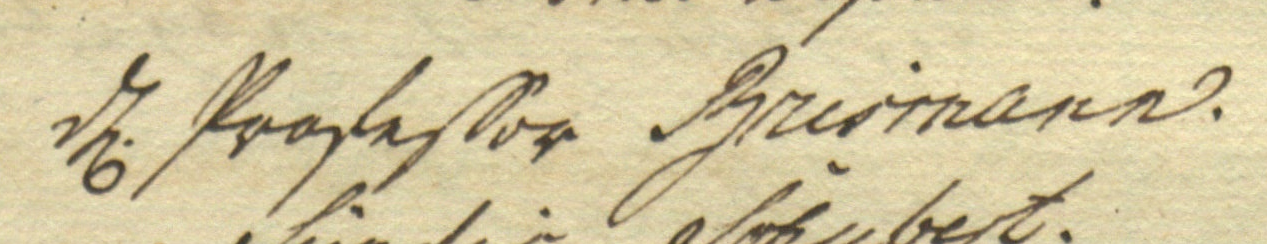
dh. Professor Brismann.
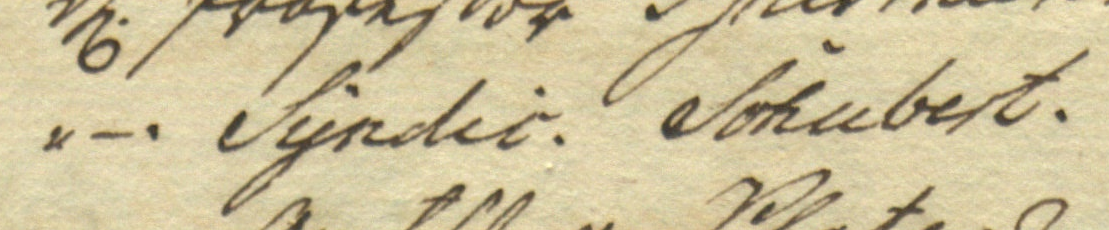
Sÿndic. Schubert.
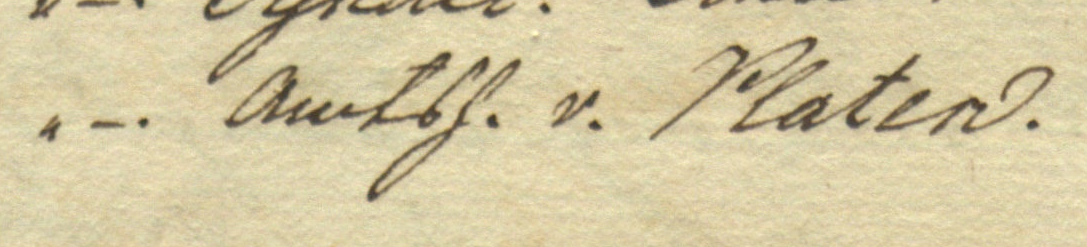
Amtsh. v. Platen.
